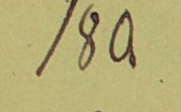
180
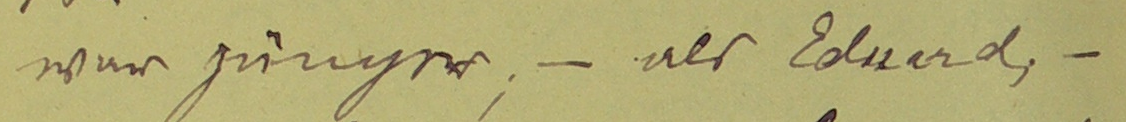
war jünger;-- als Eduard,-
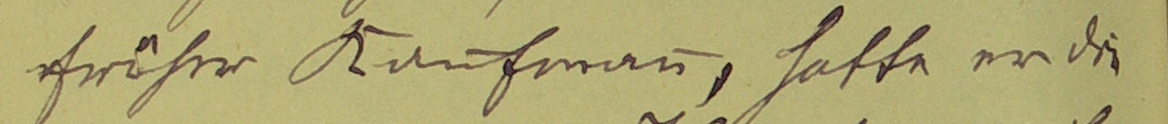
früher Kaufmann, hatte er die
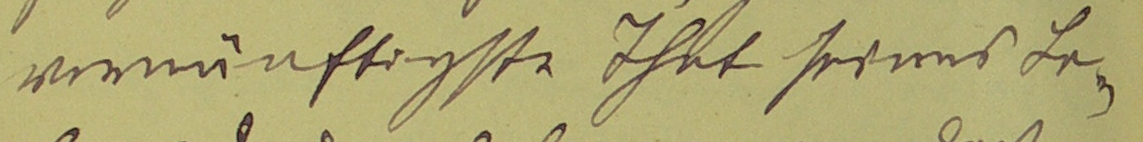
vernünftigste That seines Le¬
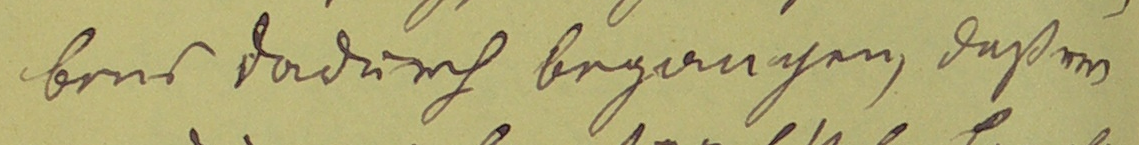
bens dadurch begangen, daß er
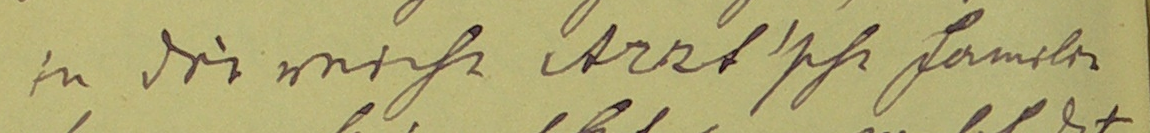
in die ??? `sche Familie
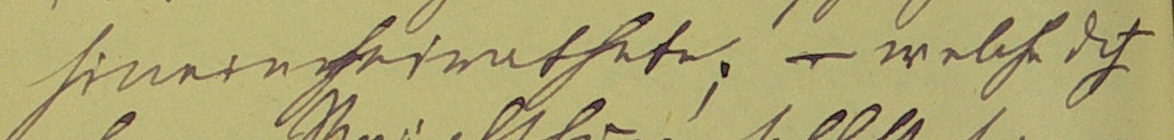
hineinheirathete; - welche dch
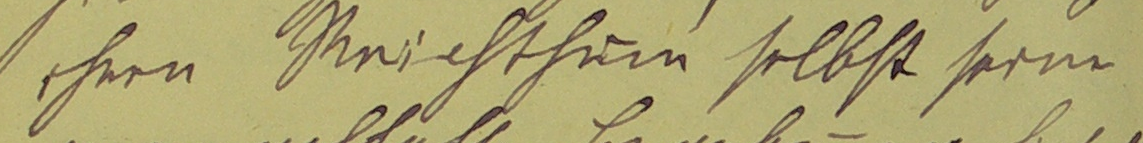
ihren Reichthum selbst seine
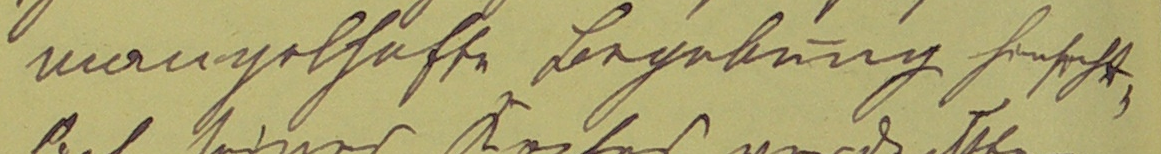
mangelhafte Begabung hinsicht¬
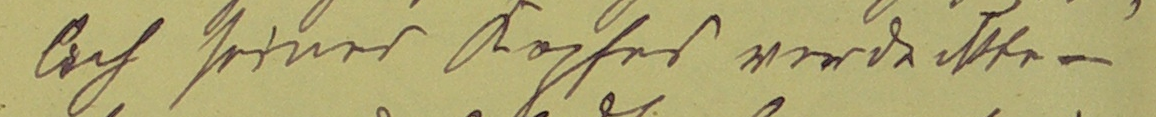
lich seines Kopfes verdeckte -
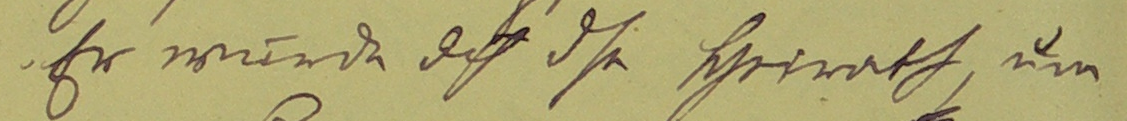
Er wurde dch dse Heirath, um
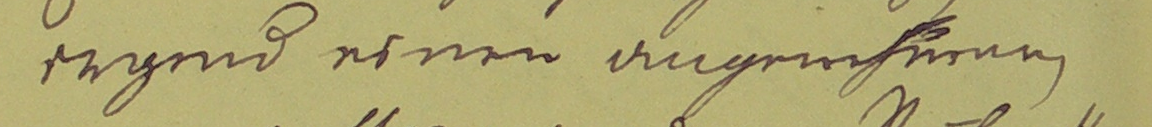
irgend einen angenehmen,
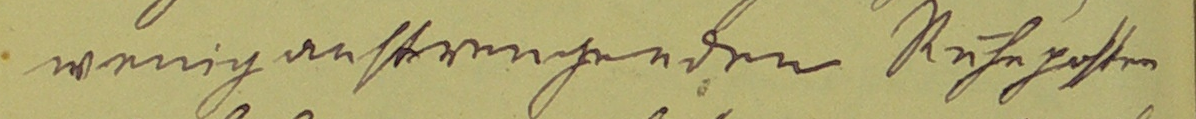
wenig anstrengenden Ruheposten
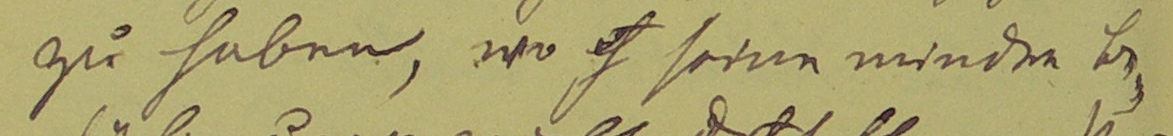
zu haben, wo ch seine mindre Be¬
